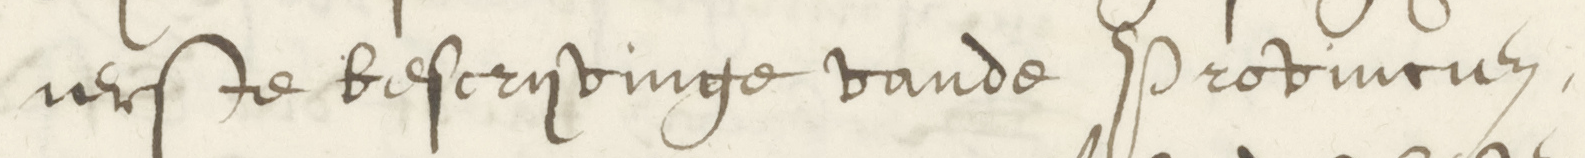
ierste bescryvinge vande Provincien,
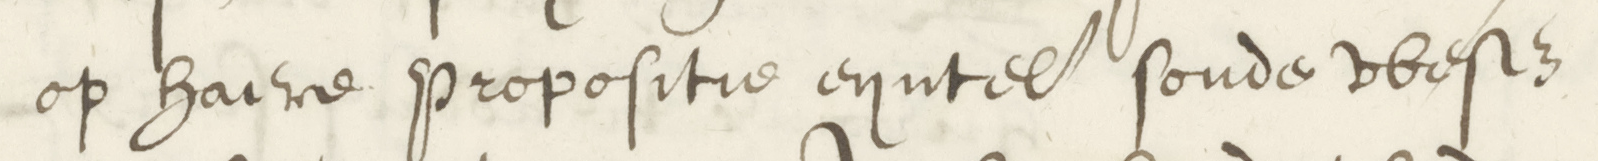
op haere propositie eyntel soude wesen
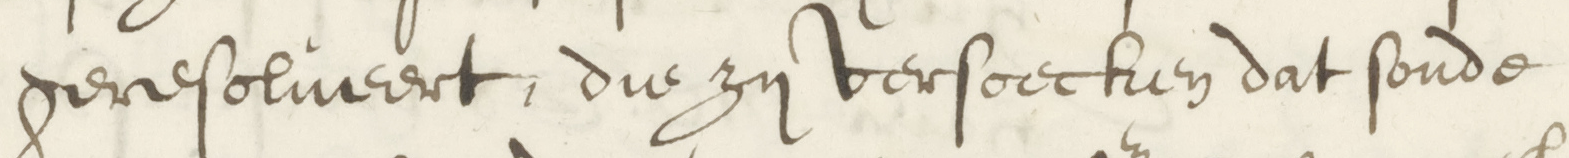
geresolueert, die zy versoecken dat soude
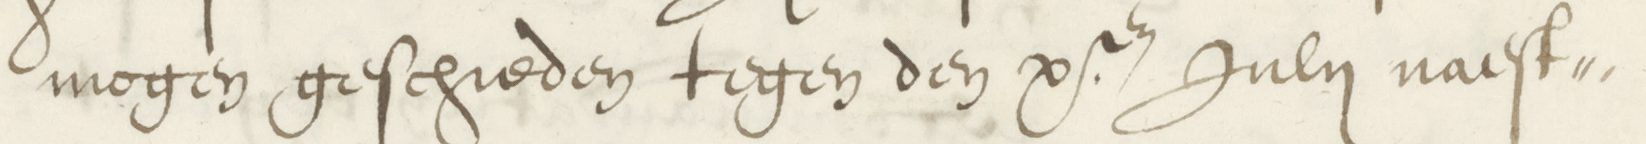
mogen geschieden tegen den xen. July naest„
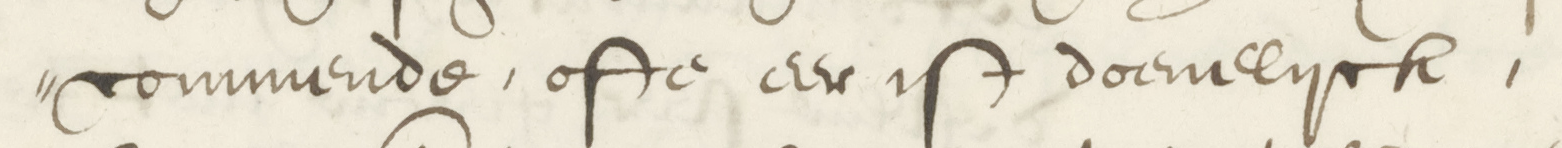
„commende, ofte eer ist doenelyck,
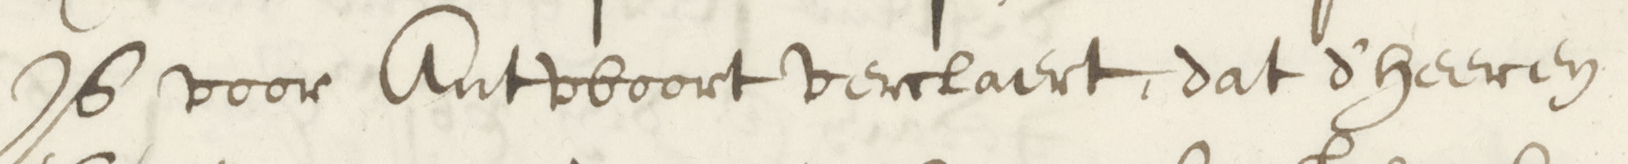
Is voor Antwoort verclaert, dat d‛heeren
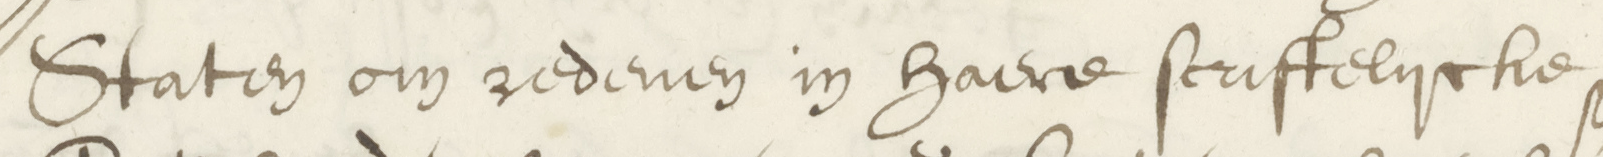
Staten om redenen in haere scriftelycke
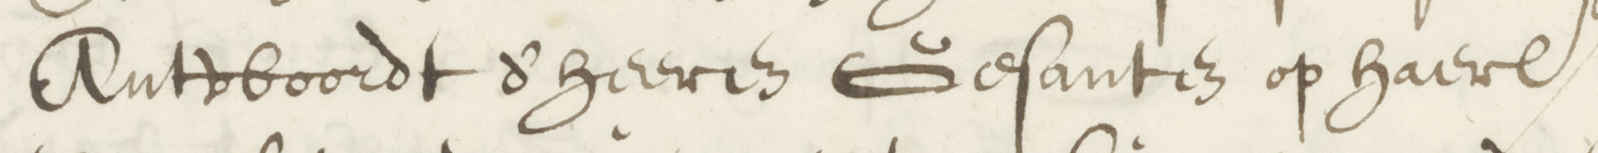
Antwoordt d‛heeren Gesanten op haerl
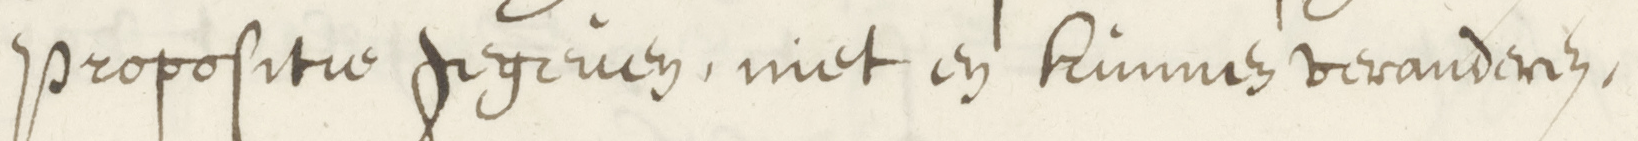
propositie gegeuen, niet en kunnen veranderen,
